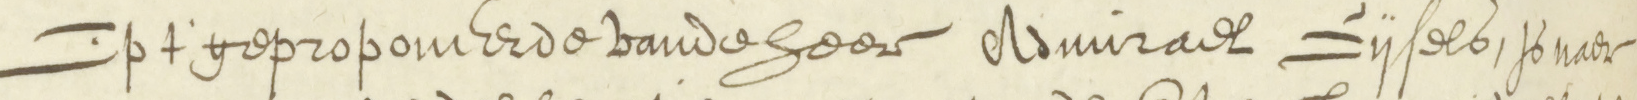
Op t‛geproponeerde vande heer Admirael Gijsels, Is naer
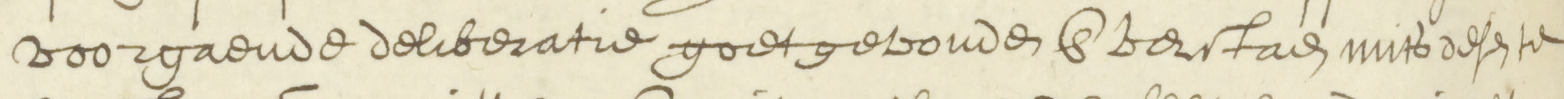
voorgaende deliberatie goetgevonden & verstaen mits desen te
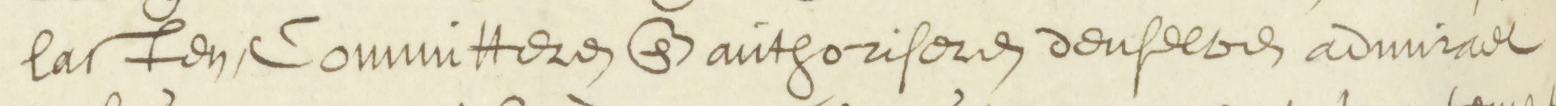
lasten, Committeren & authoriseren denselven admirael
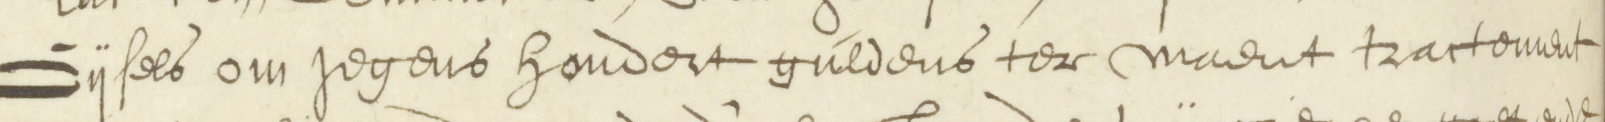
Gijsels om jegens hondert guldens ter maent tractement
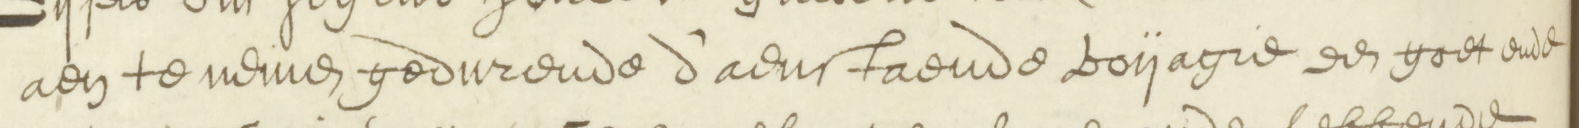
aen te nemen gedurende d‛aenstaende voijagie een goet ende
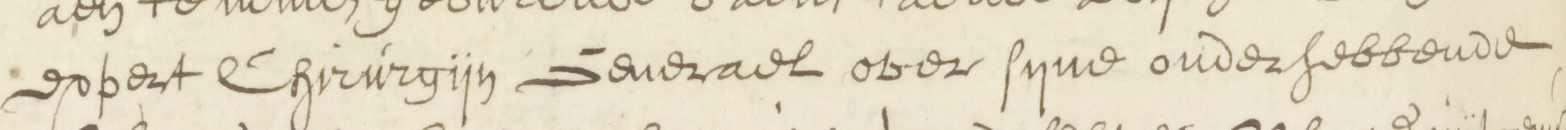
expert Chirurgijn Generael over syne onderhebbende
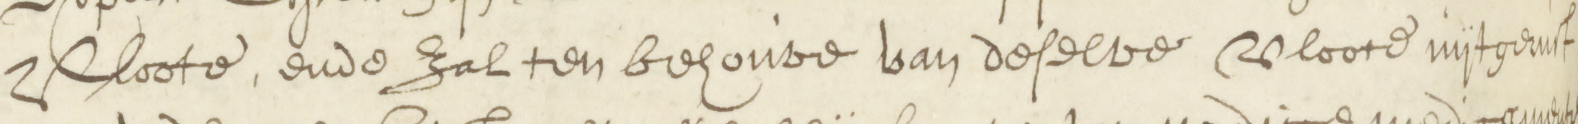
Vloote, ende zal ten behouve van deselve Vloote uijtgerust
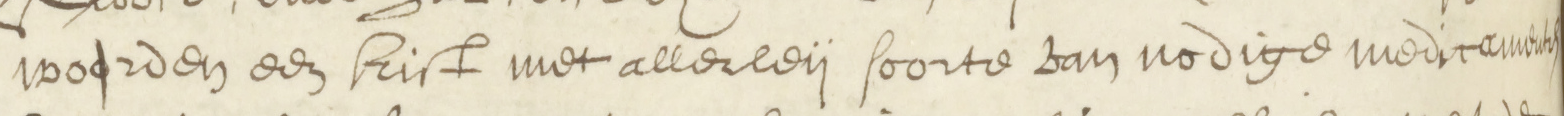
woorden een kist met allerleij soorte van nodige medicamenten
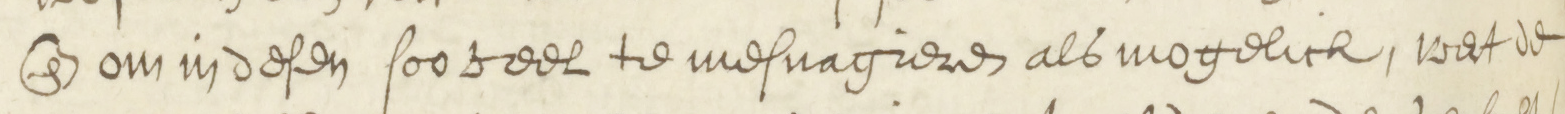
& om in desen sooveel te mesnagieren als mogelick, wat de
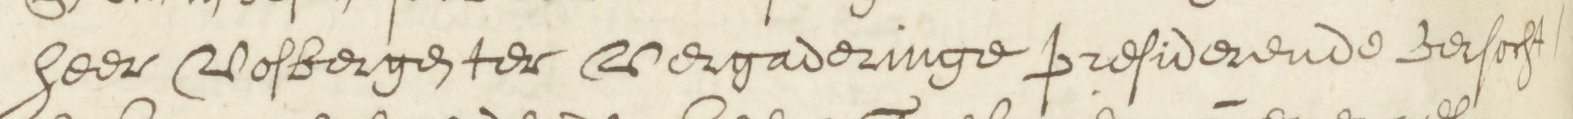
heer Vosbergen ter Vergaderinge presiderende versocht
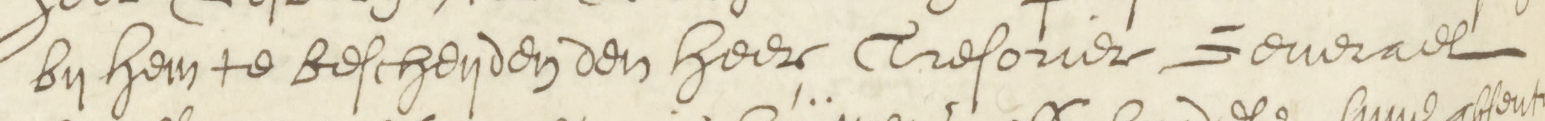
by hem te bescheyden den heer Tresorier Generael
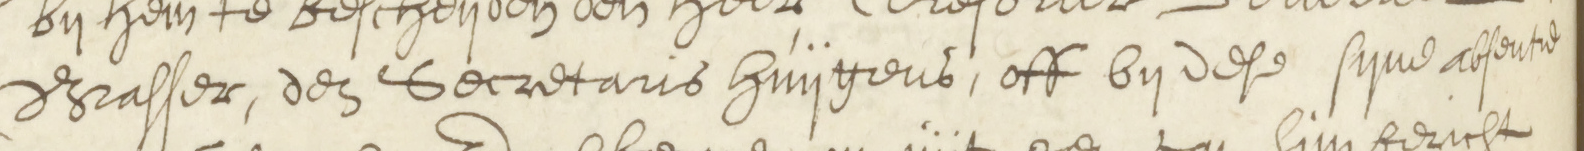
Brasser, den Secretaris Huijgens, off by dese syne absentie
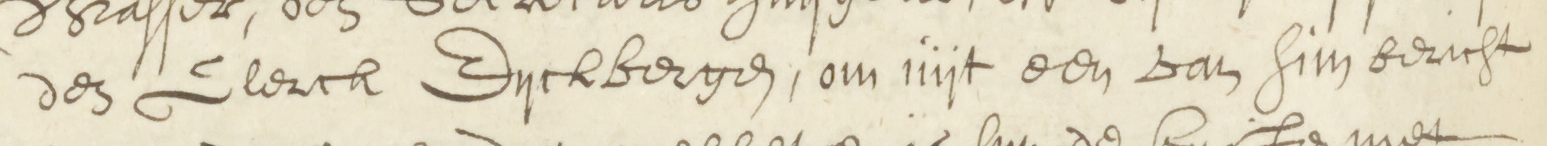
den Clerck Eyckbergen, om uijt een van hun bericht
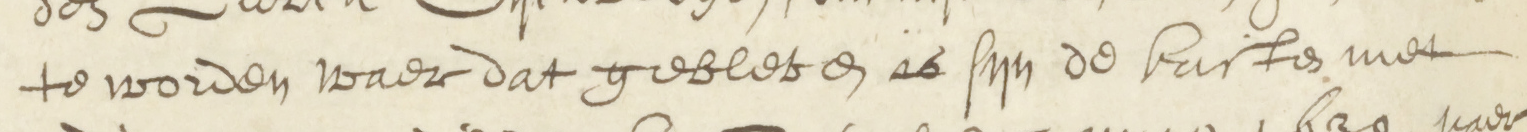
te worden waer dat gebleven is syn de kisten met
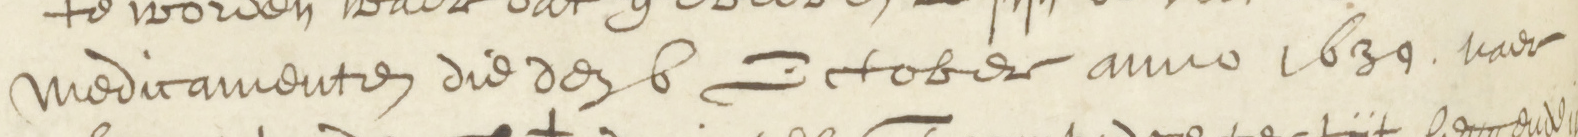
medicamenten die den 6 October anno 1639. naer
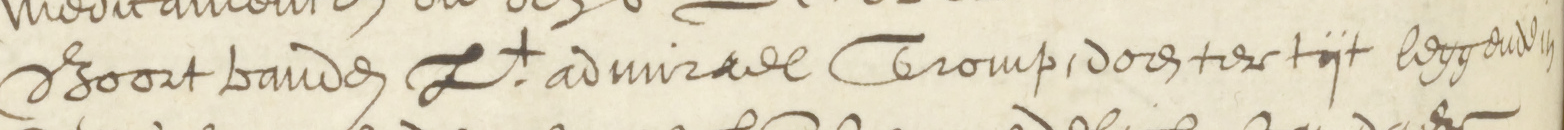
Boort vanden Lt. admirael Tromp, doen ter tijt leggende in
